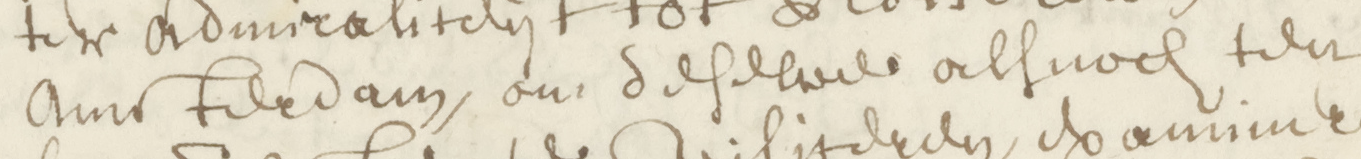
Amsterdam, om deselve alsnoch ten
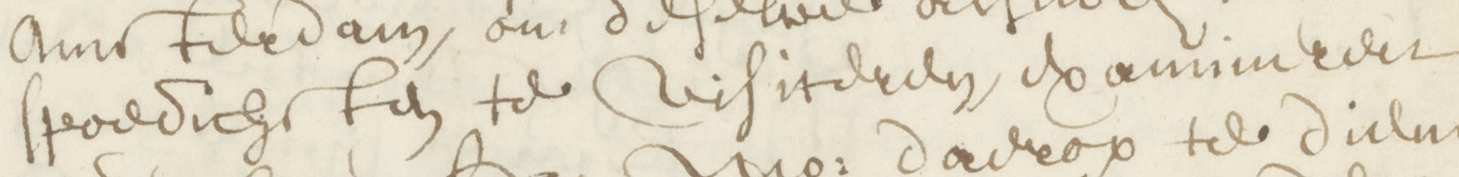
spoedichsten te visiteren, examineren
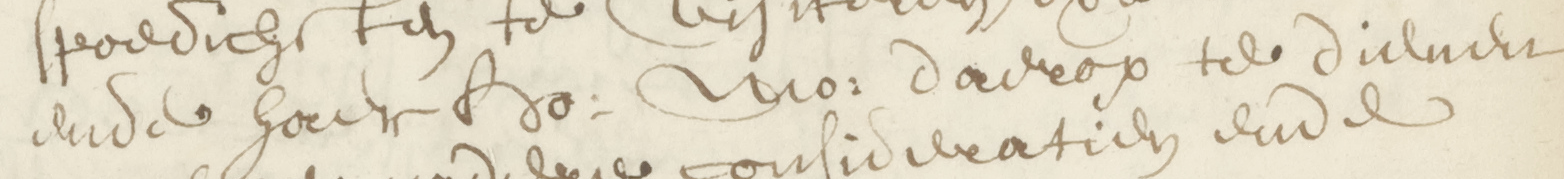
ende haer Ho:Mo: daerop te dienen
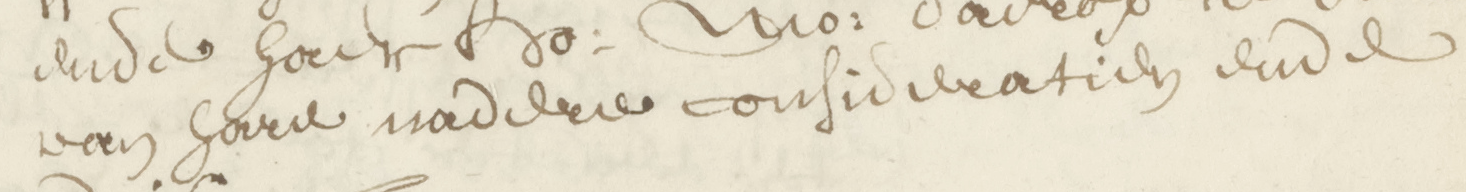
van hare nadere consideratien ende
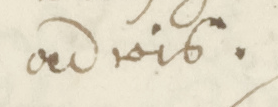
advis.
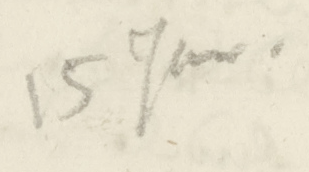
15 Jan.
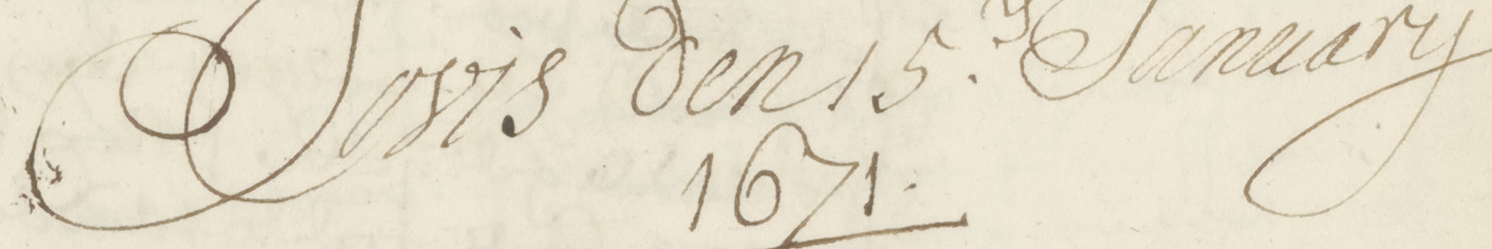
Jovis den 15.en Januarij
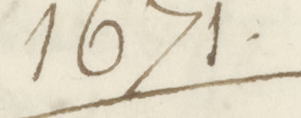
1671.
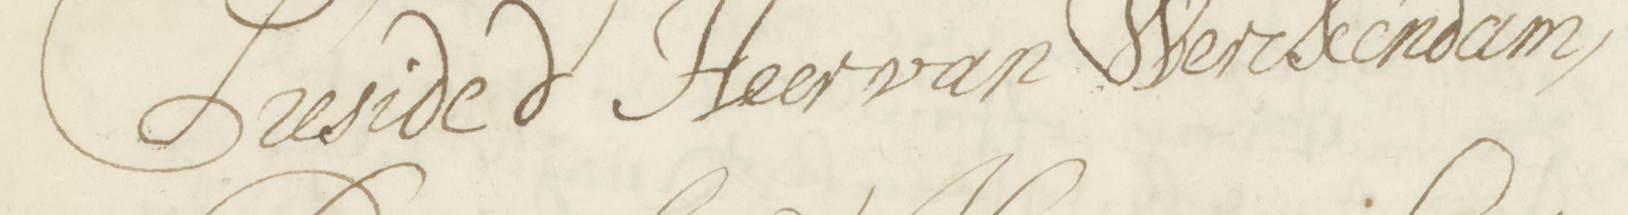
Preside d'Heer van Werckendam,
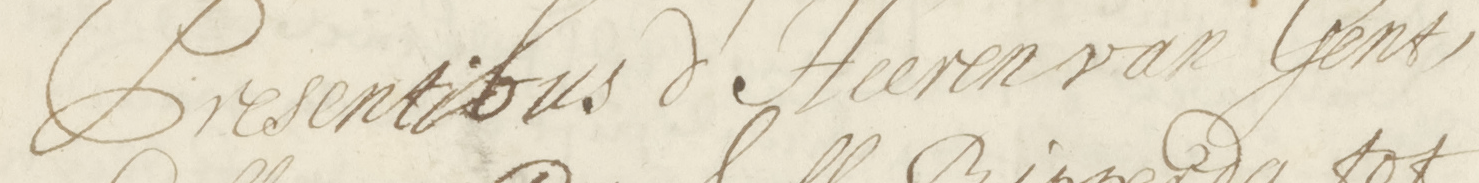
Presentibus d'Heeren van Gent,
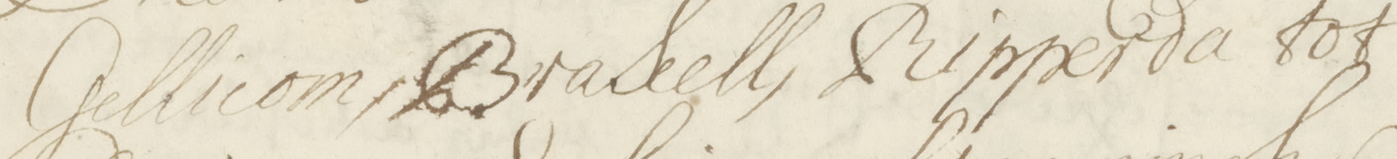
Gellicom, Brakell, Ripperda tot
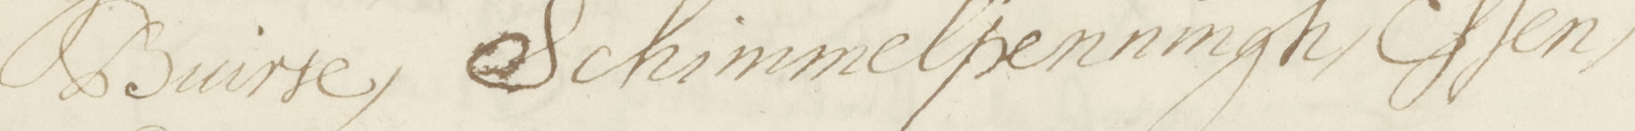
Buirse, Schimmelpenningh, Essen,
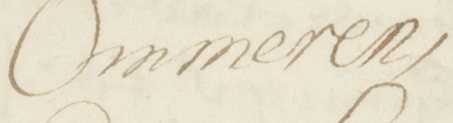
Ommeren,
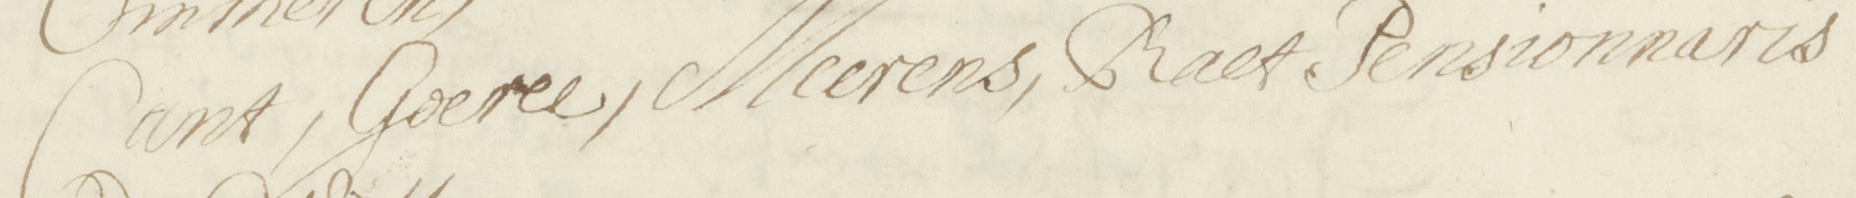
Cant, Goeree, Meerens, Raet Pensionnaris
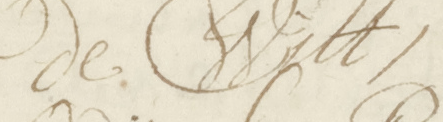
de Witt
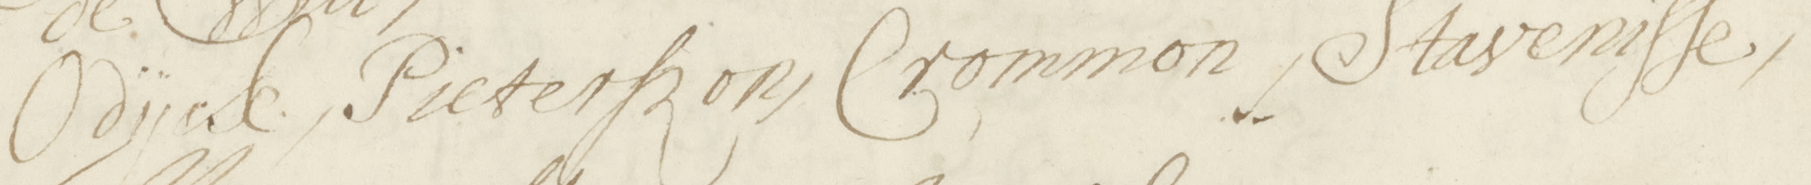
Odijck, Pieterszon, Crommon, Stavenisse,
